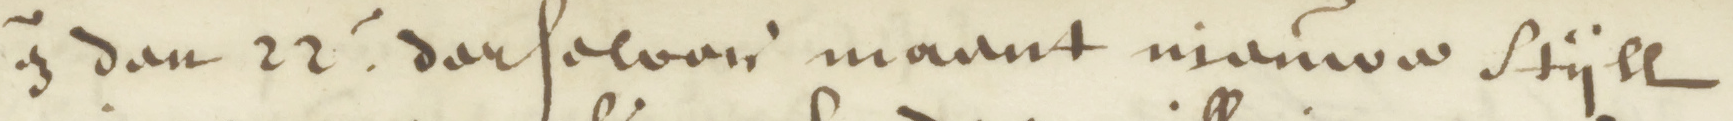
en den 22e. derselven maent nieuwe stijll
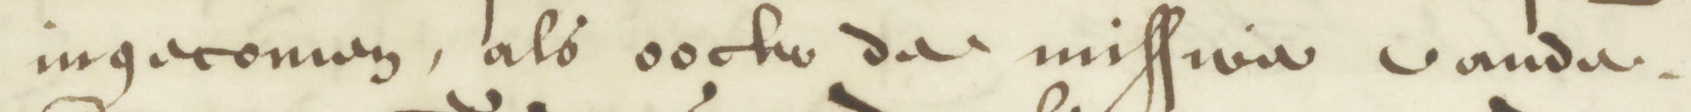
ingecomen, als oock de missive vande
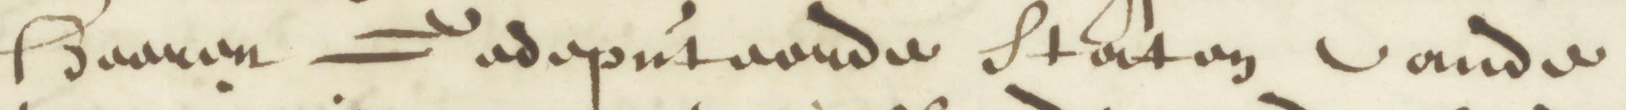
heeren Gedeputeerde Staten vande
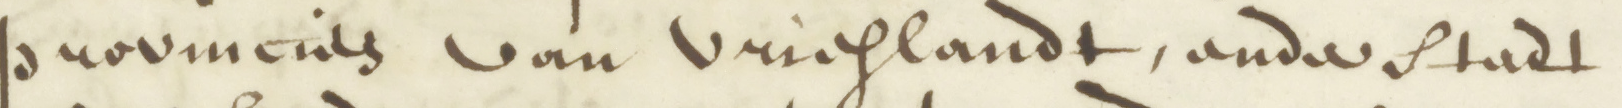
provincien van Vrieslandt, ende Stadt
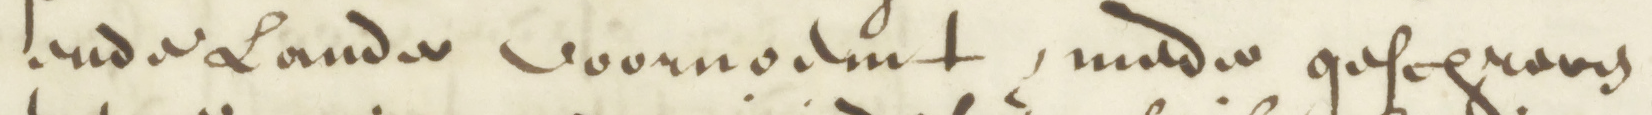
ende Lande voornoemt, mede geschreven
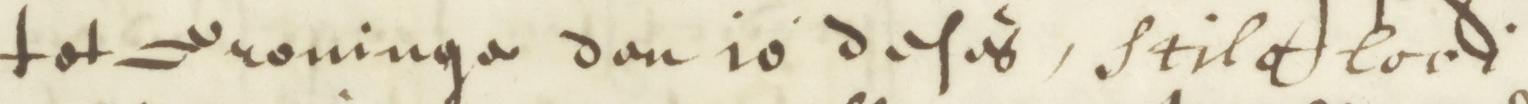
tot Groninge den 10 deses, stilo loci,
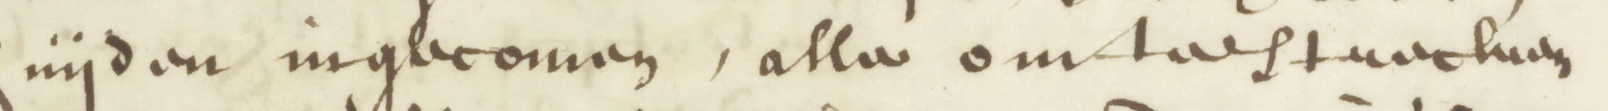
huijden ingecomen, alle om te strecken
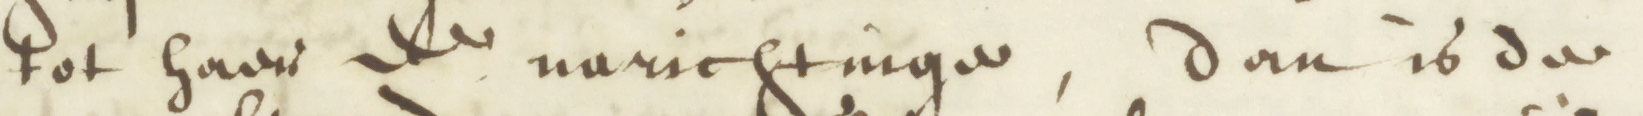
tot haer E. narichtinge, dan is de
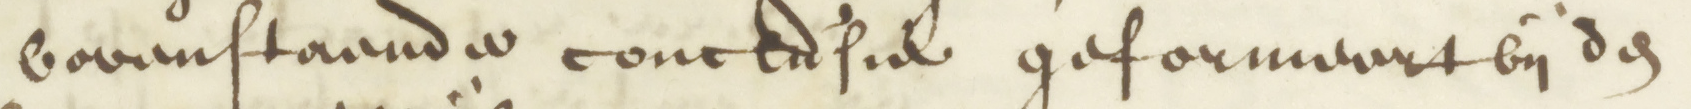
bovenstaende conclusie geformeert bij den
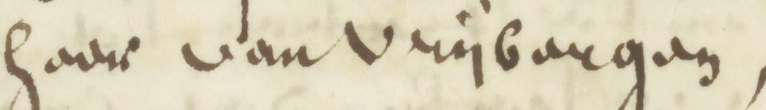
heer van Vrijbergen.
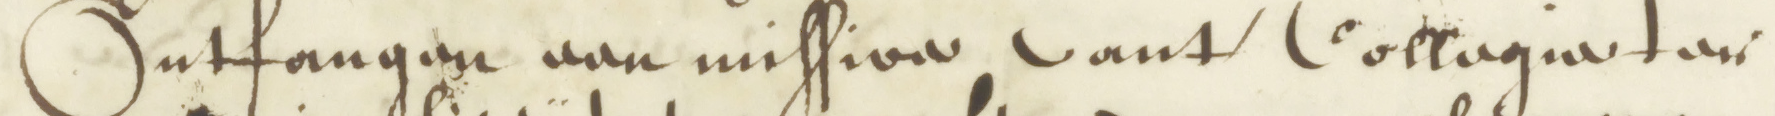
Ontfangen een missive vant Collegie ter
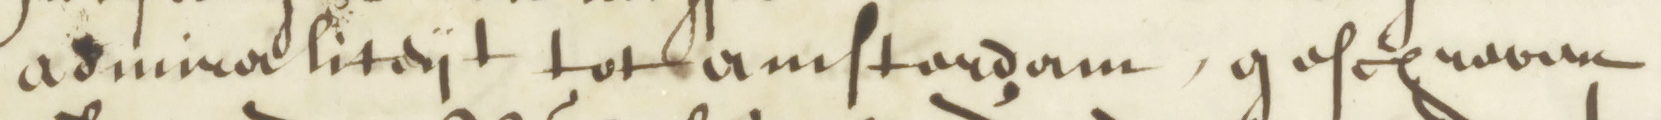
admiraliteijt tot amsterdam, geschreven
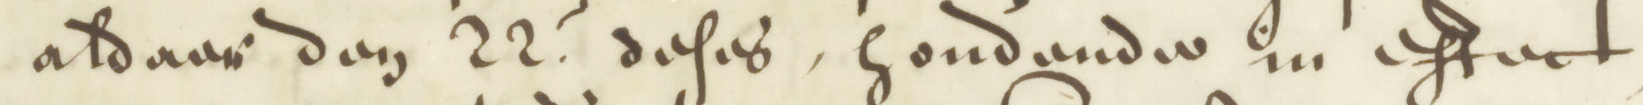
aldaer den 22e deses, houdende in effect,
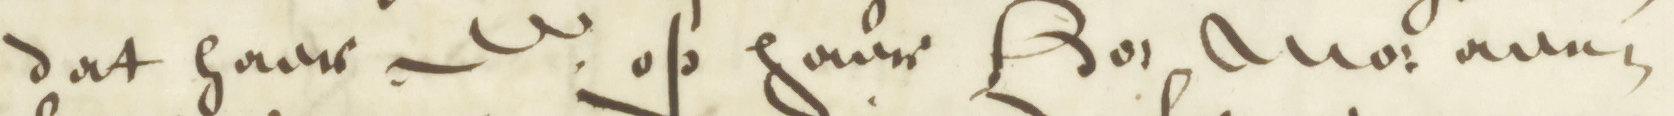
dat haer E. op haer Ho: Mo: aen„
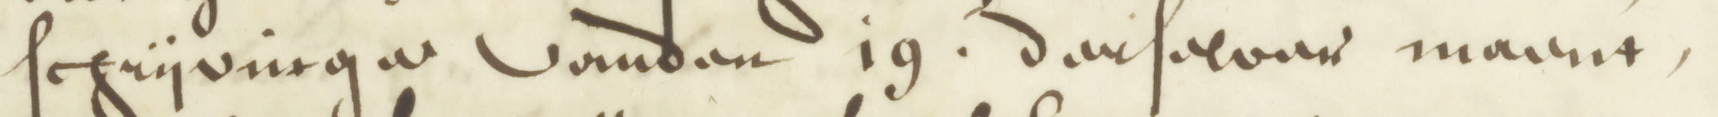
schrijvinge vanden 19. derselver maent,
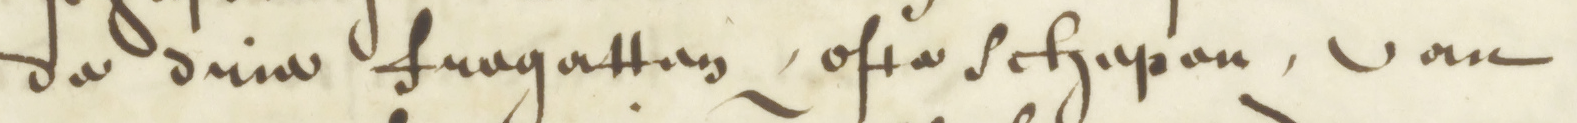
de drie fregatten, ofte schepen van
